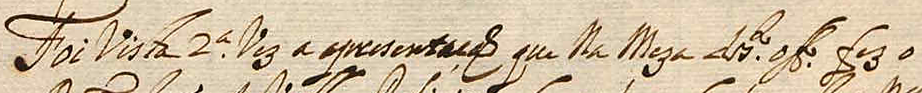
Foi Vista 2.a Vez a apresentaçaõ que Na Meza do s.to off.o fez o
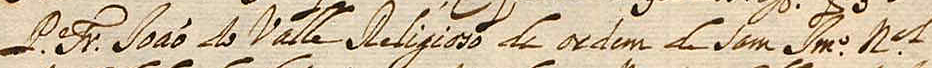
P.e Fr. Ioaõ do Valle Religioso da ordem de Sam Im.o N.al
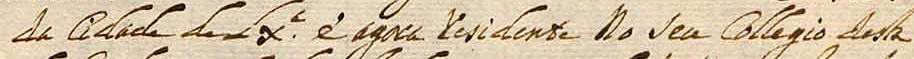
da Cidade de Lx.a e agora residente No seu Collegio desta
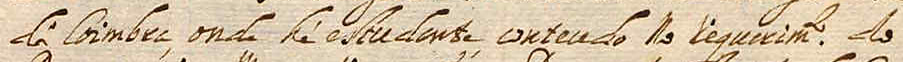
de Coimbra, onde hé estudante, conteudo no requerim.to do
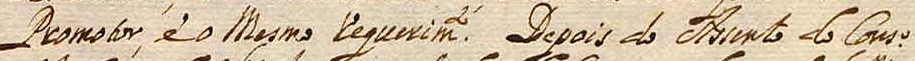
Promotor, e o Mesmo requerim.to Depois do Assento do Cons.o
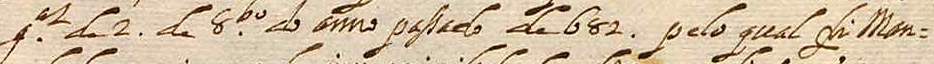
g.al de 2. de 8.bro do anno passado de 682. pelo qual foi Man
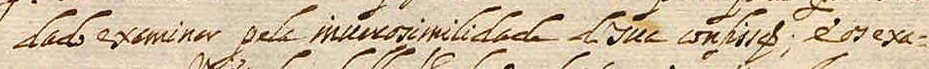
dado examinar pela inuerosimilidade de sua confissaõ; e os exa
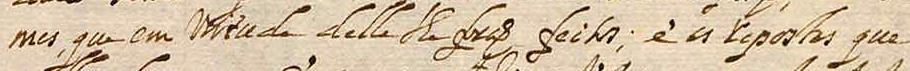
mes, que em virtude delle lhe foraõ feitos; e as repostas que
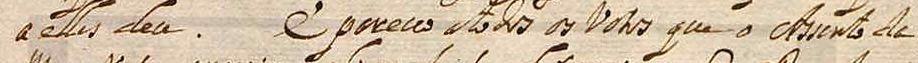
a elles deu. E pareceo a todos os Votos que o Assento de
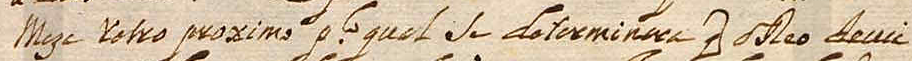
Meza retro proximo p.lo qual se determinara q̄ o Reo deuia
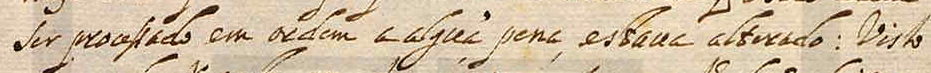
ser processado em ordem a alguā pena, estaua alterado: Visto
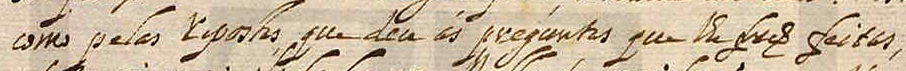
como pelas repostas, que deu ás preguntas que lhe foraõ feitas,
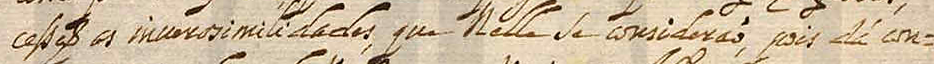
cessaõ as inuerosimilidades, que Nelle se consideraõ, pois dá con
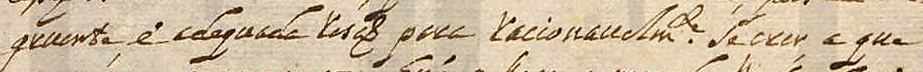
gruente, e adequada resaõ para racionauelm.te se crer, a que
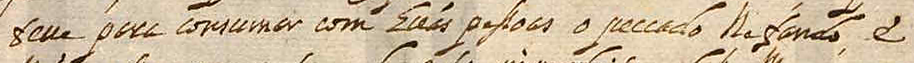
teue pera consumar com huās pessoas o peccado Nefando, e
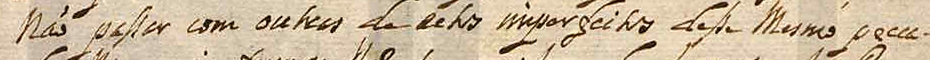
naõ passar com outras de actos imperfeitos desse Mesmo pecca
